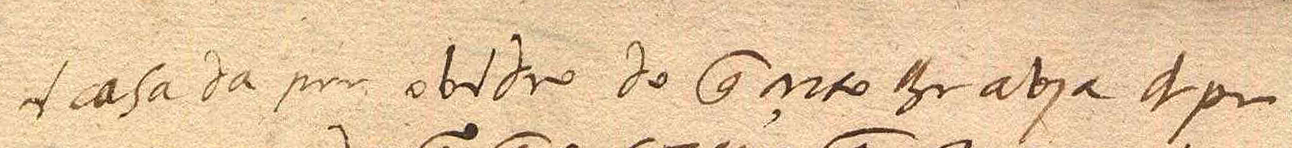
ē casa da ree o vēdeo do q̄ certo lhe avja de pe
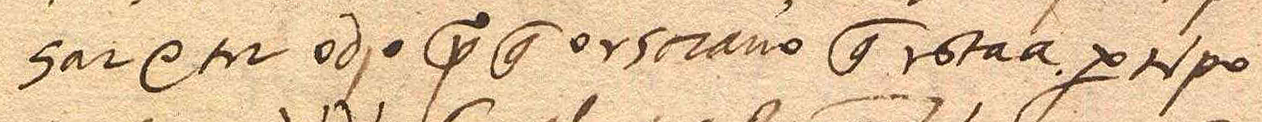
sar e ter odjo p̄oq̄ o escrauo q̄ estaa ꝑ tēpo
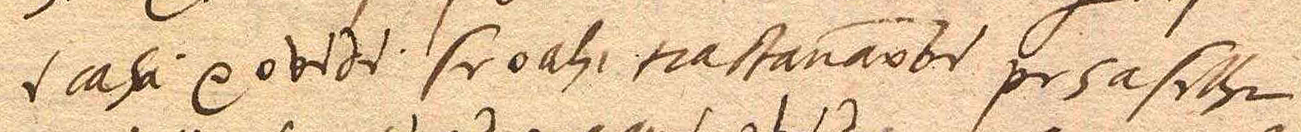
ē casa e o vēdē se o ahi tractauão bē pesa se lhe
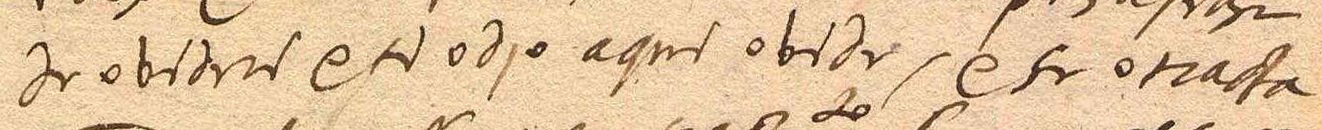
de o vēderē e tē odjo a quē o vēde / e se o tracta
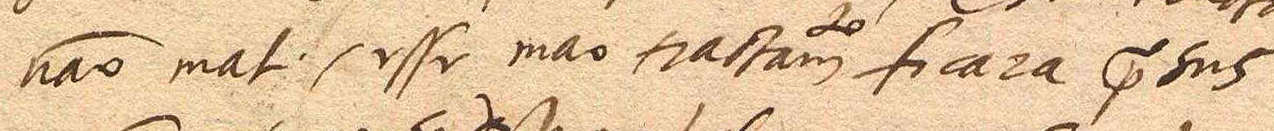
uão mal / esse mao tractamto ficara p̄o sus
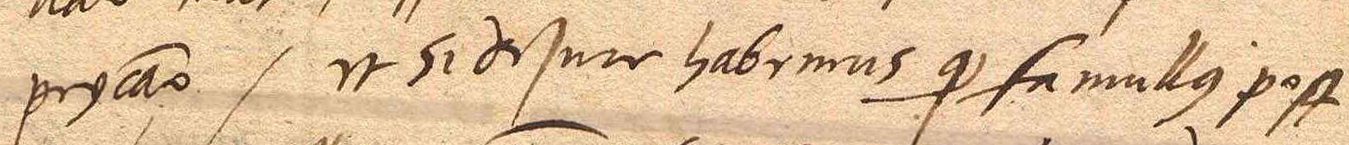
peyção / et si de Jure habemus ꝙ famullꝯ post
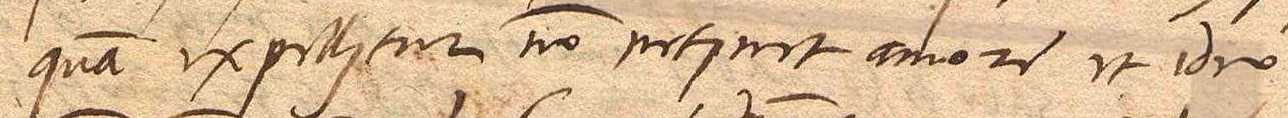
quā expelljtur n̄o retjnet amorē et ideo
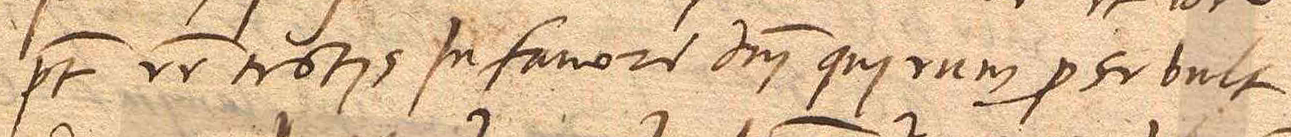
pt̄ eē testjs Jn fauorē dnj̄ quj eum ꝓ se vult
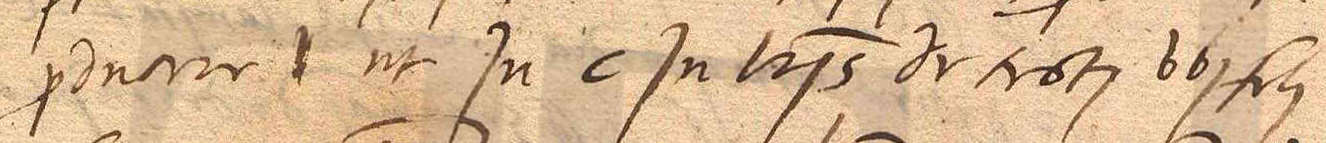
ꝓducere ut Jn c Jn lrj̄s de testj vbj felj
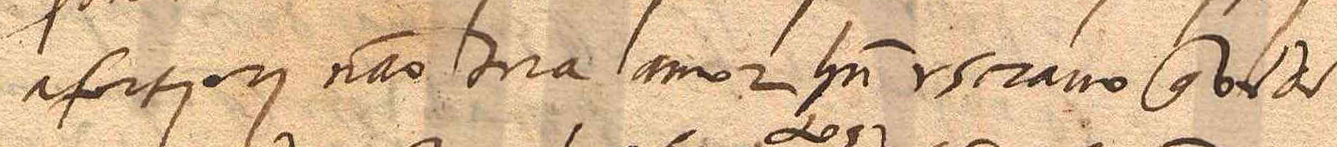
a fortjorj não tera amor hū escrauo q̄ vēdē
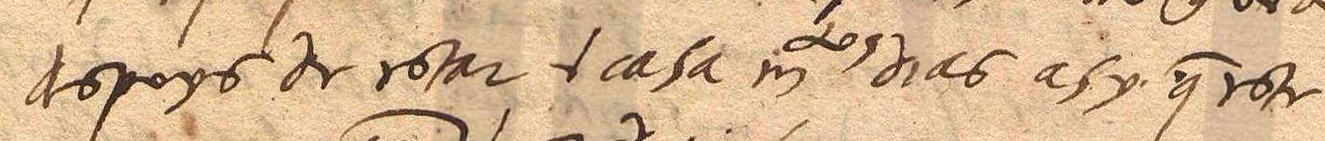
despoys de estar ē casa mtos dias asy q̄ este
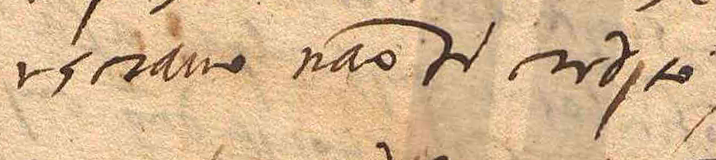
escrauo não tē credjto
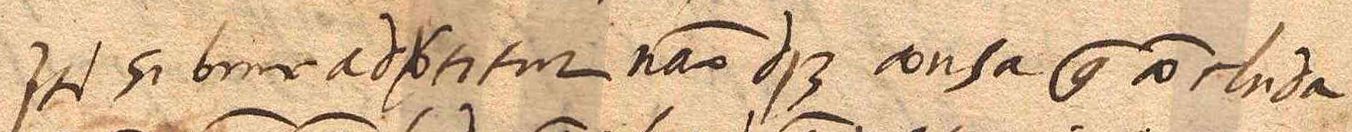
Jtē si bene adꝟtitur não djz cousa q̄ cōcluda
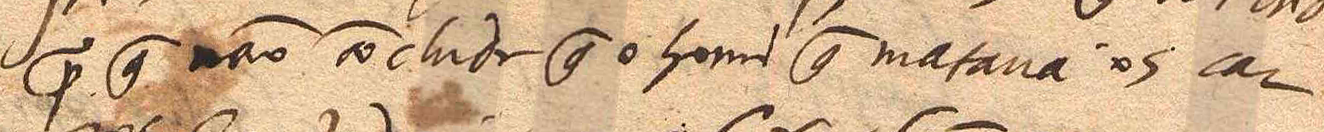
p̄oq̄ não c̄oclude q̄ o homē q̄ mataua os car
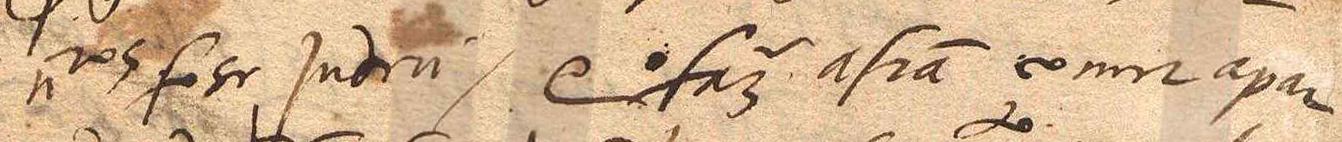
nros fose Judeu / e o faz̄ a srā comer apar
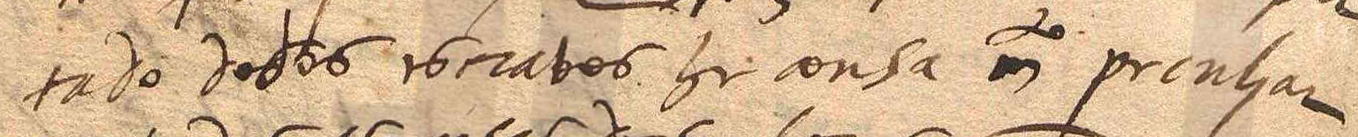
tado do dōs escravos he cousa mto peculjar
